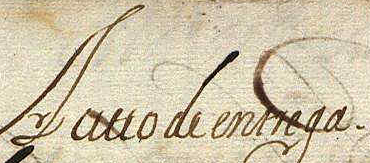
Autto de entrega.
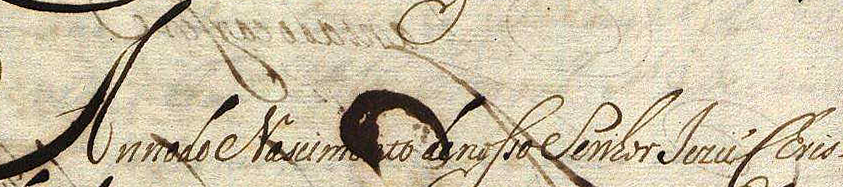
Anno do Nascim__to de nosso Senhor Iezū Chris
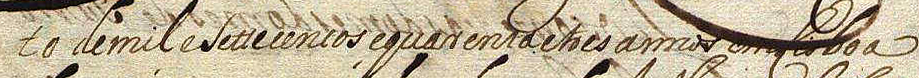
to de mil e settecentos, e quarenta e tres annos em Lisboa
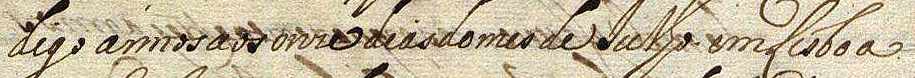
digo annos aos onze dias do mes de Iulho em Lisboa
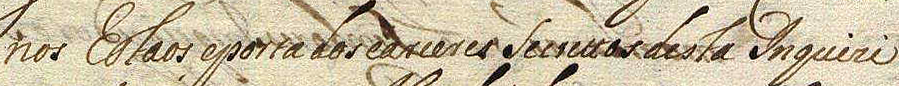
nos Estaos, e porta dos carceres secrettos desta Inquizi
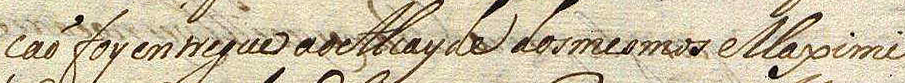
çaõ foy entregue ao Alcayde dos mesmos Maximi
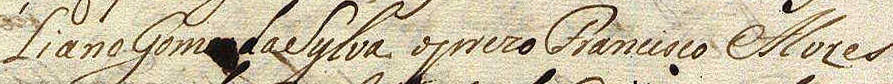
liano Gom_ da Sylva o prezo Francisco Alvres
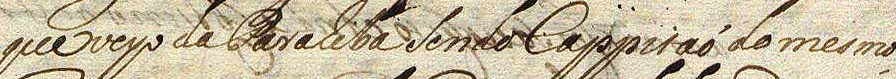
que veyo da Parahiba sendo Cappitaõ do mesmo,
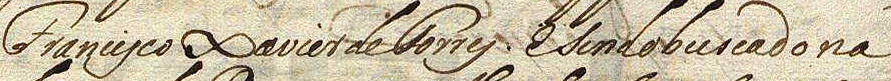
Francisco Xavier de Torres. E sendo buscado na
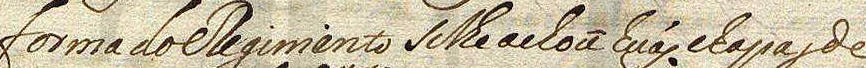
forma do Regimento selhe achoû huās chapas de
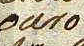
ouro
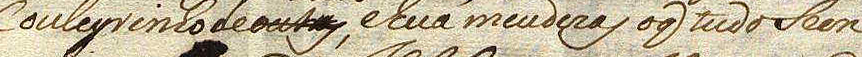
couleyrinho de outras, e huā meudezas o q̄ tudo se en
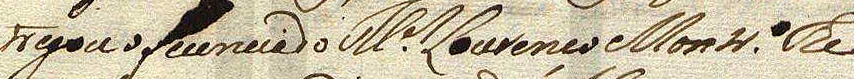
tregou o Lecenciado M.el Lourenço Montr.o The
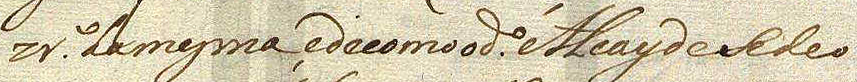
zr.o da mesma, e de como o d.o Alcayde se deo
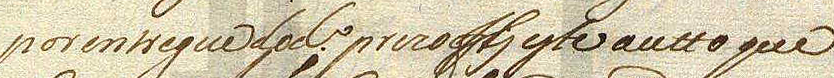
por entregue do d.o prezo ffis este autto que
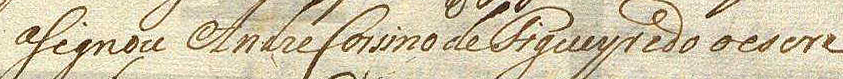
asignou Andre Corsino de Figueyredo o escre
